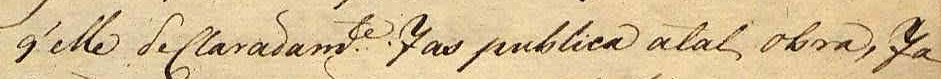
q̄ elle deClaradam.te fas publica a tal obra, fa
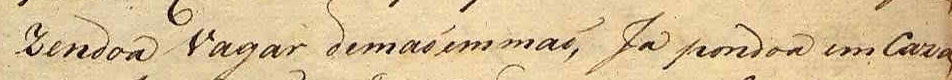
Zendoa Vagar de maõ em maõ, Ja pondoa em caza
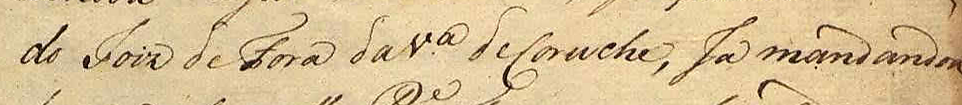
do Ioiz de Fora da V.a de Coruche, Ja mandandoa
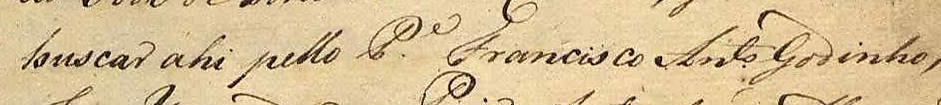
buscar ahi pello P.e Francisco Ant.o Godinho,
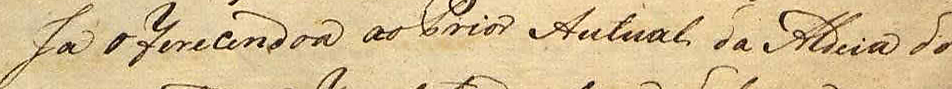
Ja oferecendoa ao Prior Autual da Aldeia do
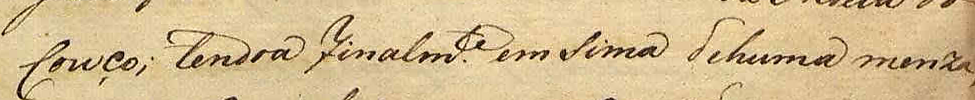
Couço; tendoa finalm.te em sima de huma menza
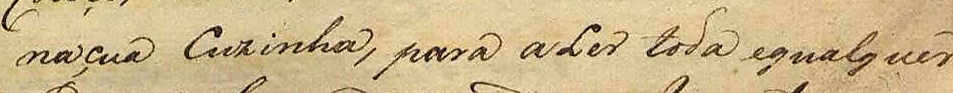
na çua Cuzinha, para a Ler toda e qualquer
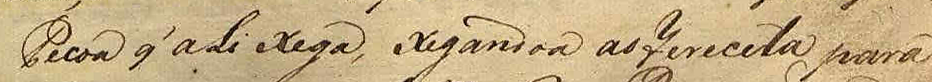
Peçoa q̄ aLi xega, xegandoa a oferecela para
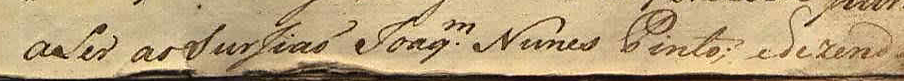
a Ler ao Surjiaõ Ioaq.m Nunes Pinto; e dezend
